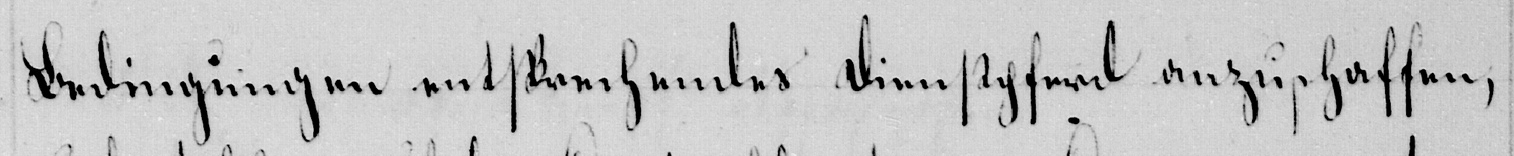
Bedingungen entsprechendes Dienstpferd anzuschaffen,
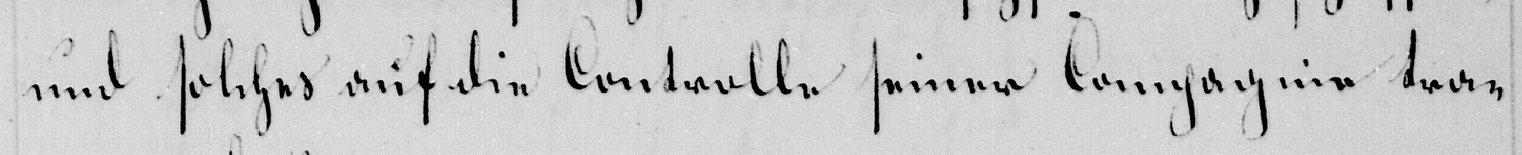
und solches auf die Controlle seiner Compagnie tra¬
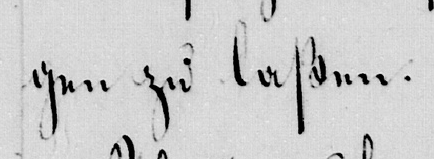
gen zu laßen.
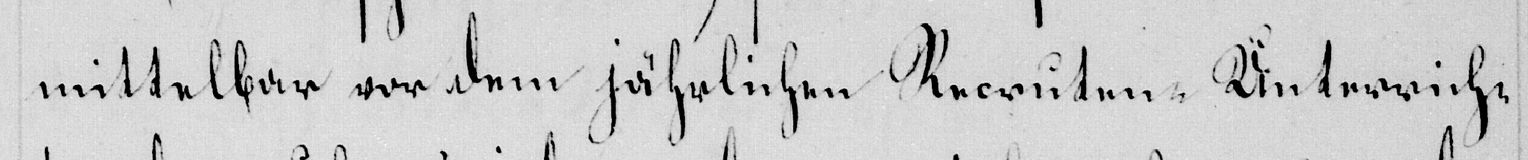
mittelbar vor dem jährlichen Recruten-Unterrich¬
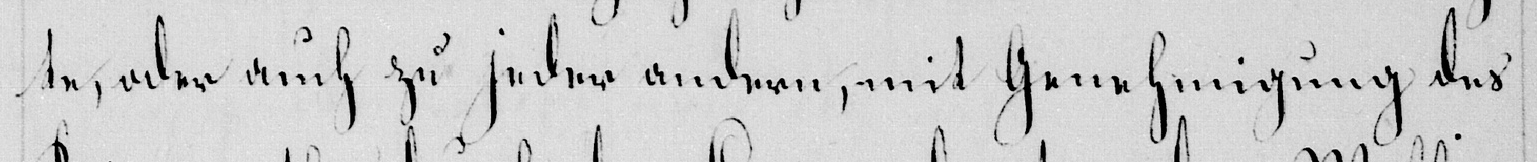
te, oder auch zu jeder andern, mit Genehmigung des
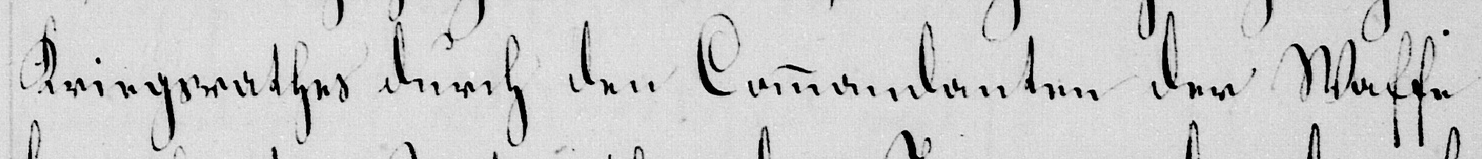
Kriegsrathes durch den Commandanten der Waffe
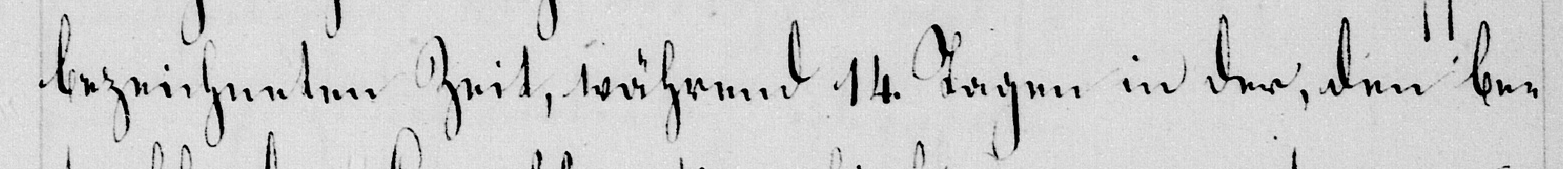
bezeichneten Zeit, während 14. Tagen in der, den be¬
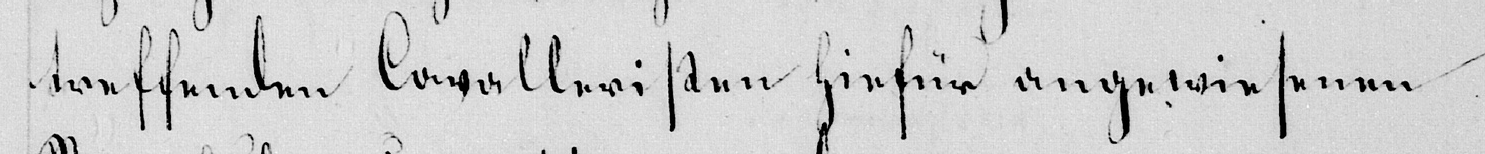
treffenden Cavalleristen hiefür angewiesenen
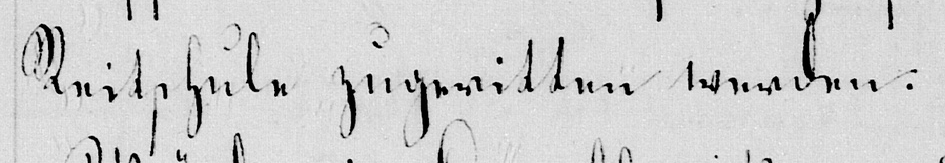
Reitschule zugeritten werden.
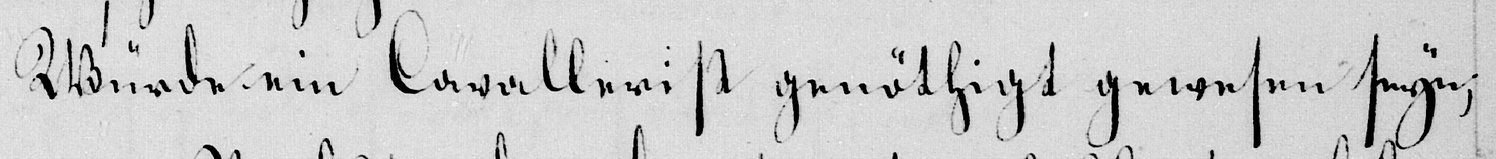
Würde ein Cavallerist genöthigt gewesen seyn,
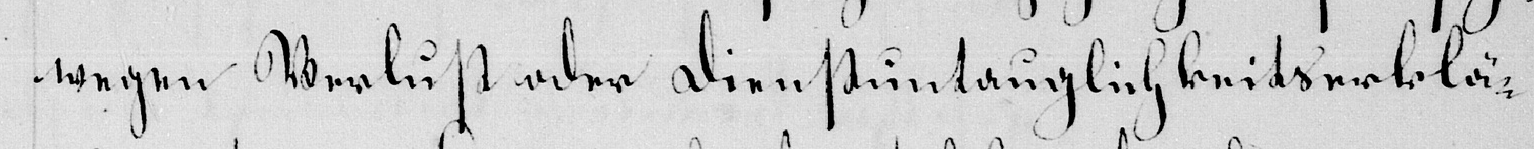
wegen Verlust oder Dienstuntauglichkeitserklä¬
